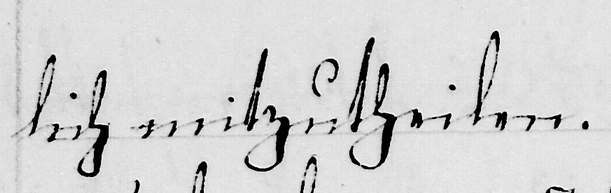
lich mitzutheilen.
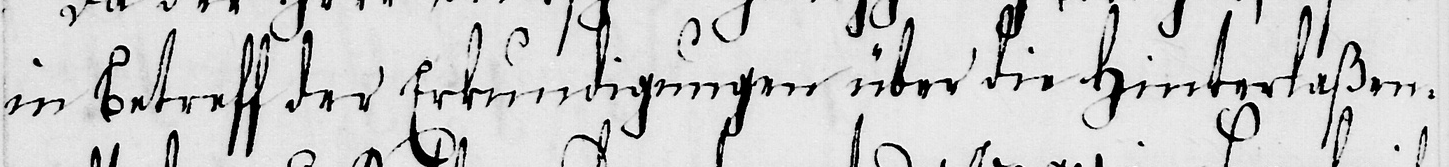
in Betreff der Erkundigungen über die Hinterlaßen¬
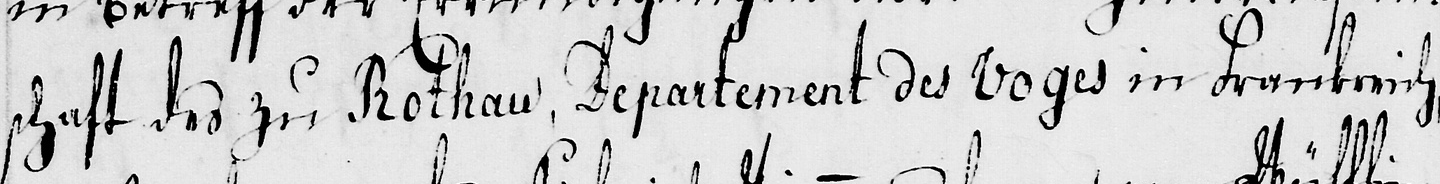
schaft des zu Rothau, Departement des Voges in Frankreich,
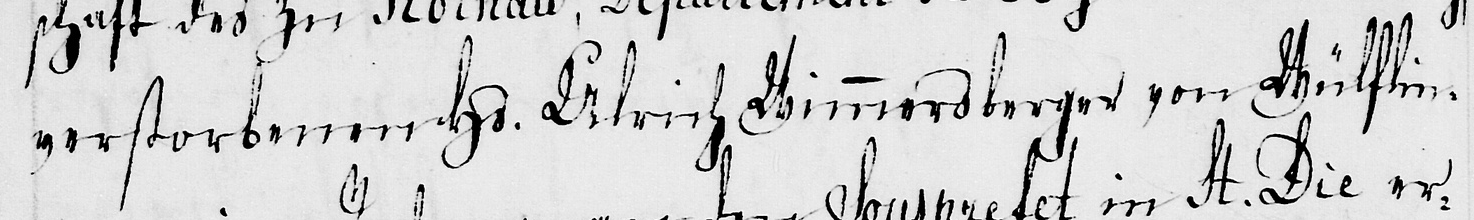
verstorbenen Hs. Ulrich Wimmersberger von Wülflin¬
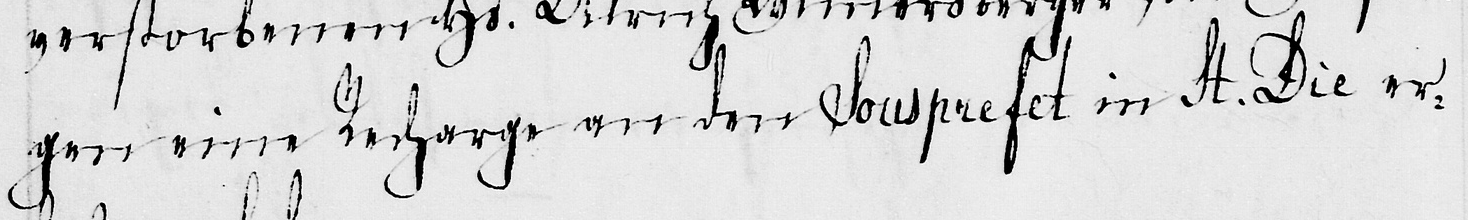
gen eine Recharge an den Sousprefet in St. Die er¬
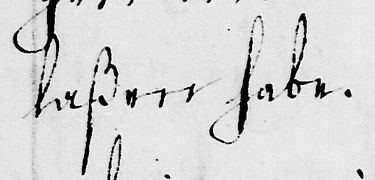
laßen habe.
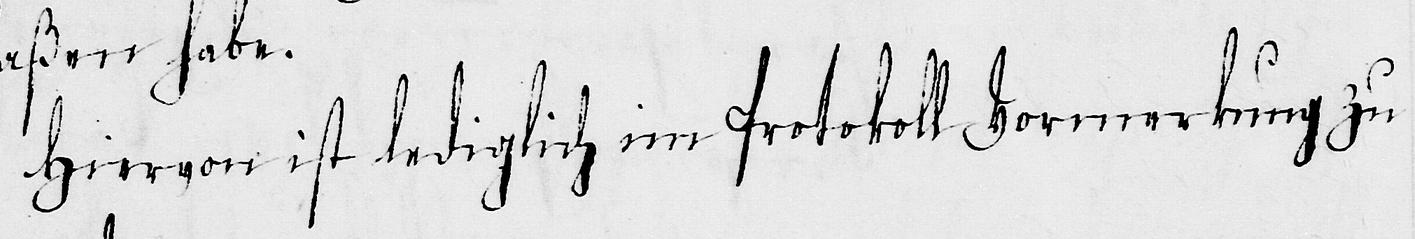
Hiervon ist lediglich im Protokoll Vormerkung zu
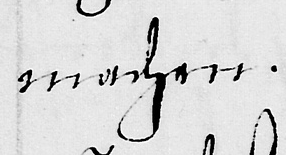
machen.
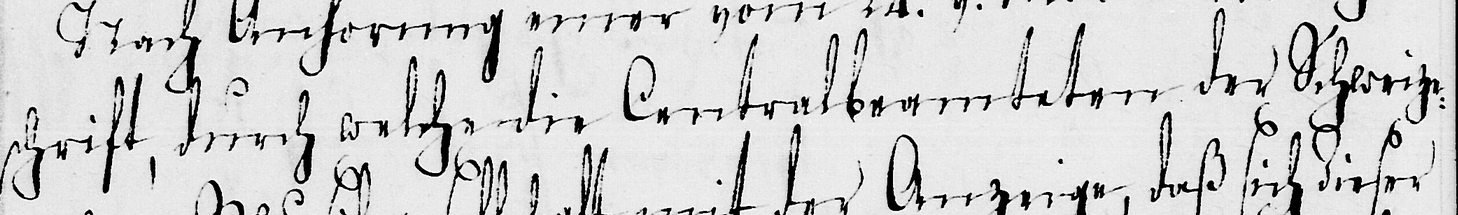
chrift, durch welche die Centralbeamteten der Schweiz¬
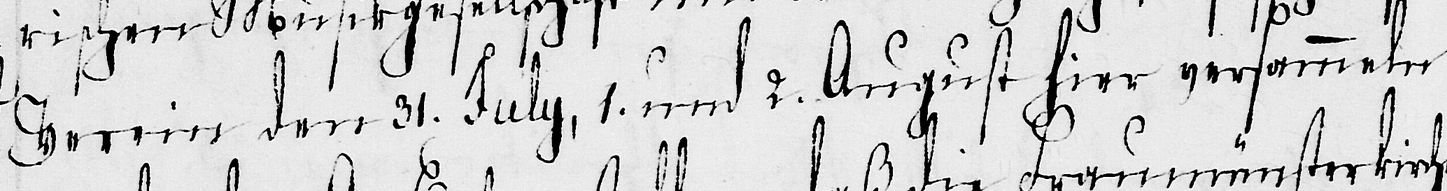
Verein den 31. July, 1. und 2. August hier versammeln
